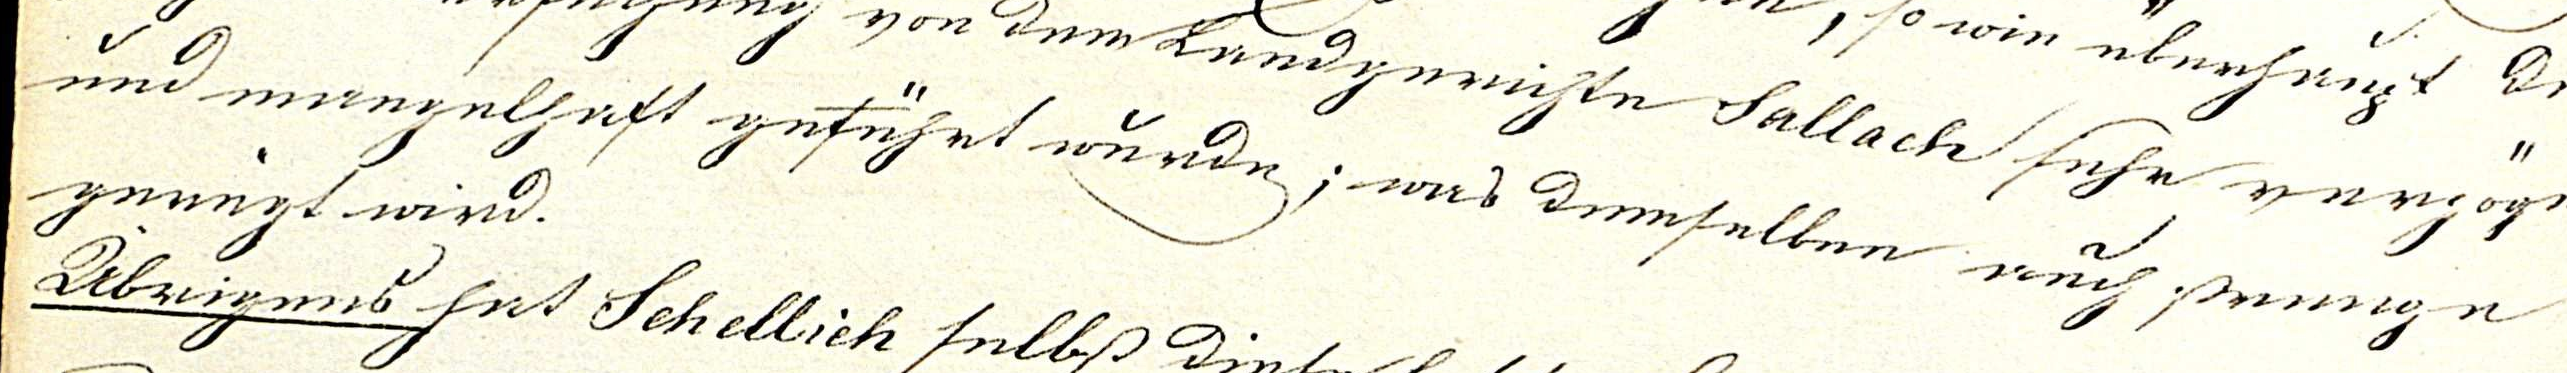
und mangelhaft geführt wurde; was demselben auch strenge
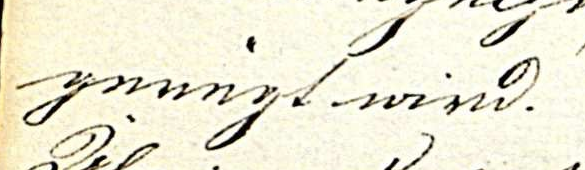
gereyt wird.
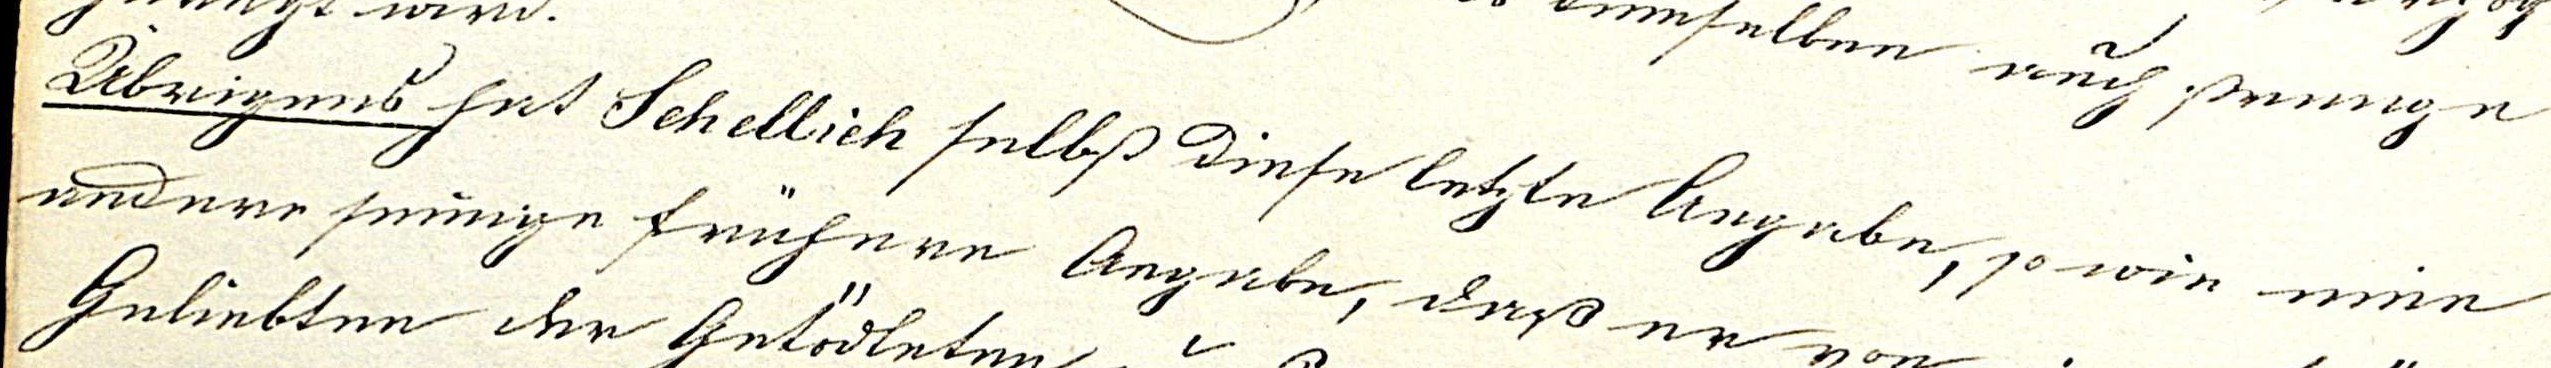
Übrigens hat Schellich selbst diese letzte Angabe, so wie eine
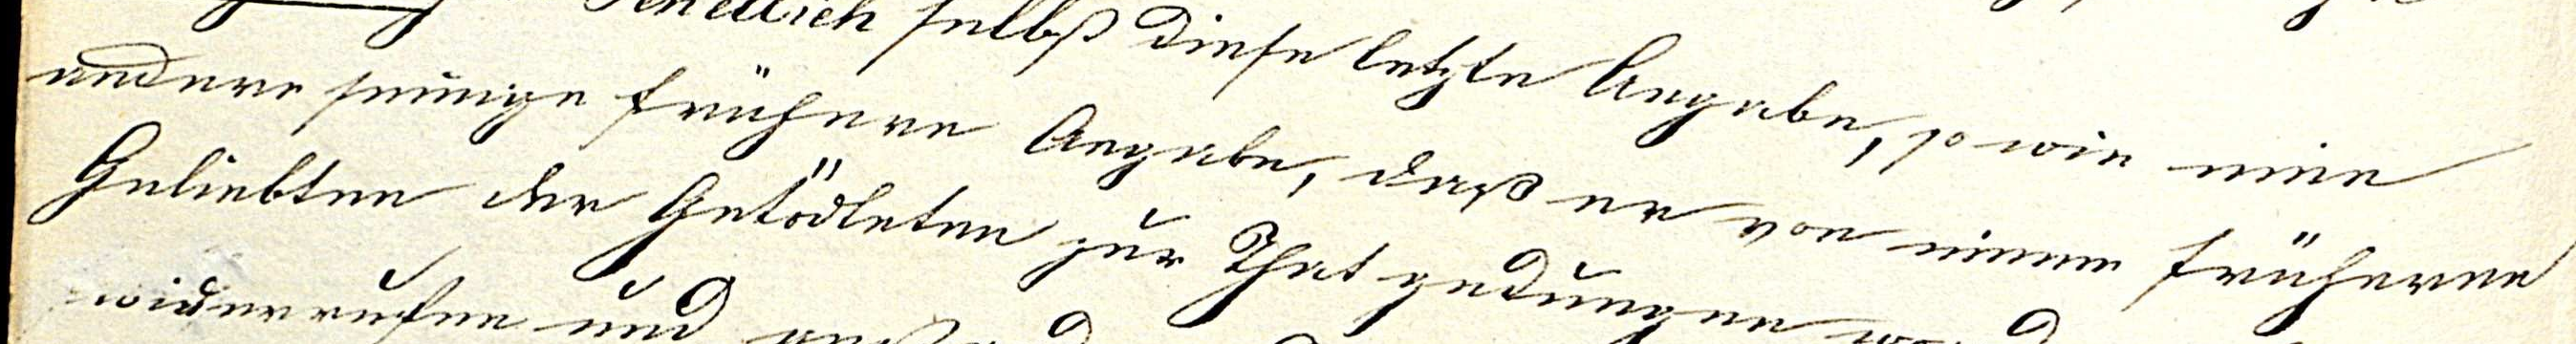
andere seinige frühere Angabe, daß er von einem früheren
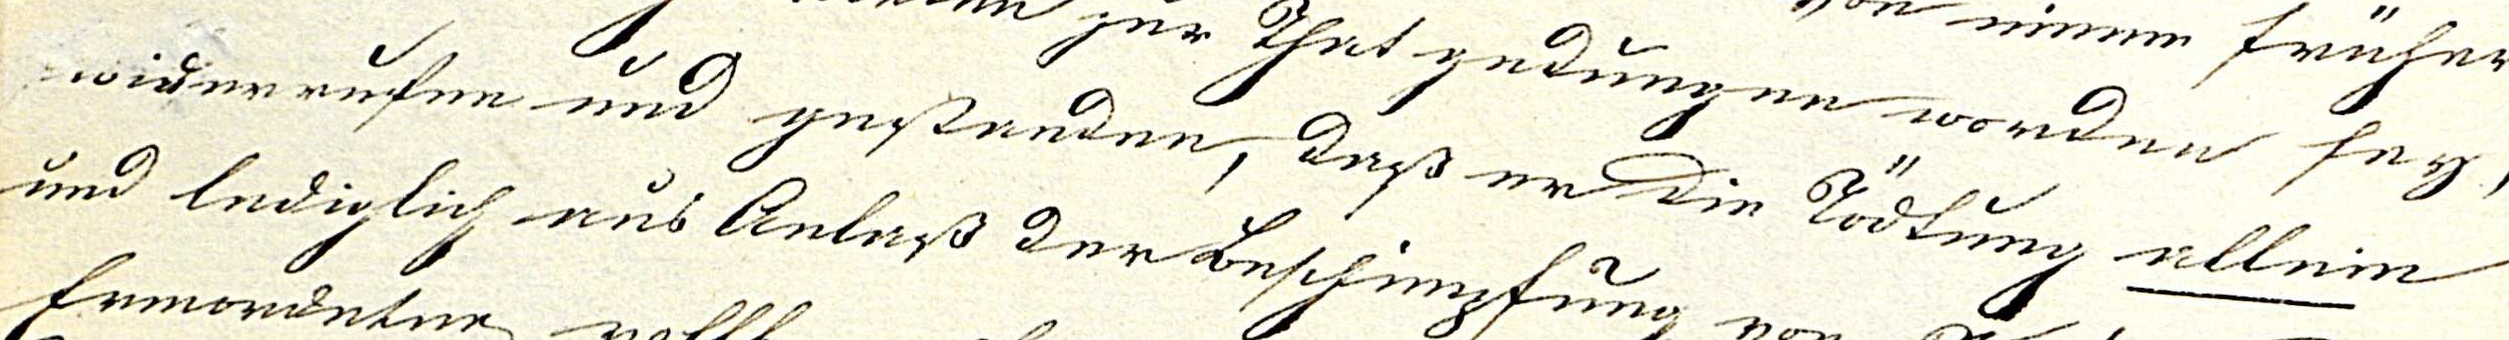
wider rufen und gestanden, daß er die Tödtung allein
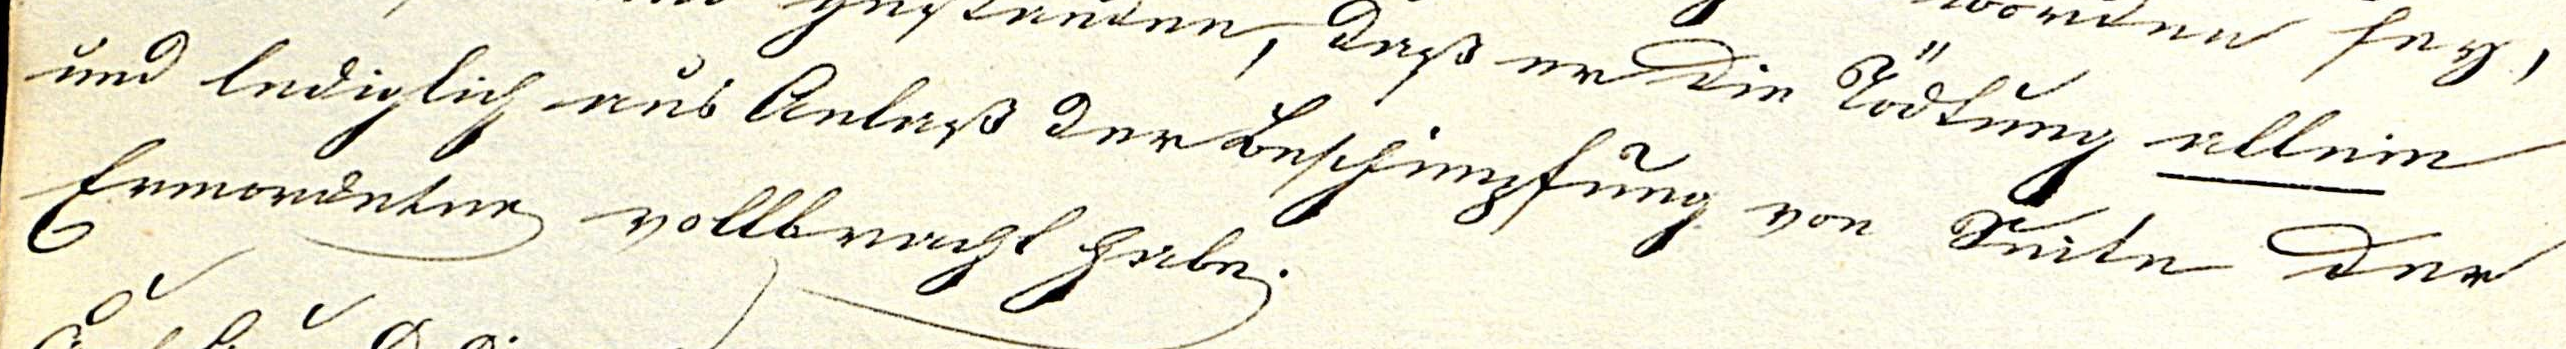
und lediglich aus Anlaß der Beschimpfung von Seite der
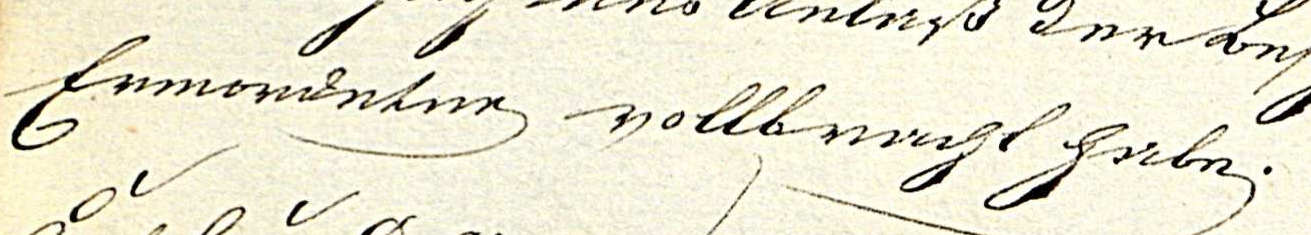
Ermordeten vollbracht habe.
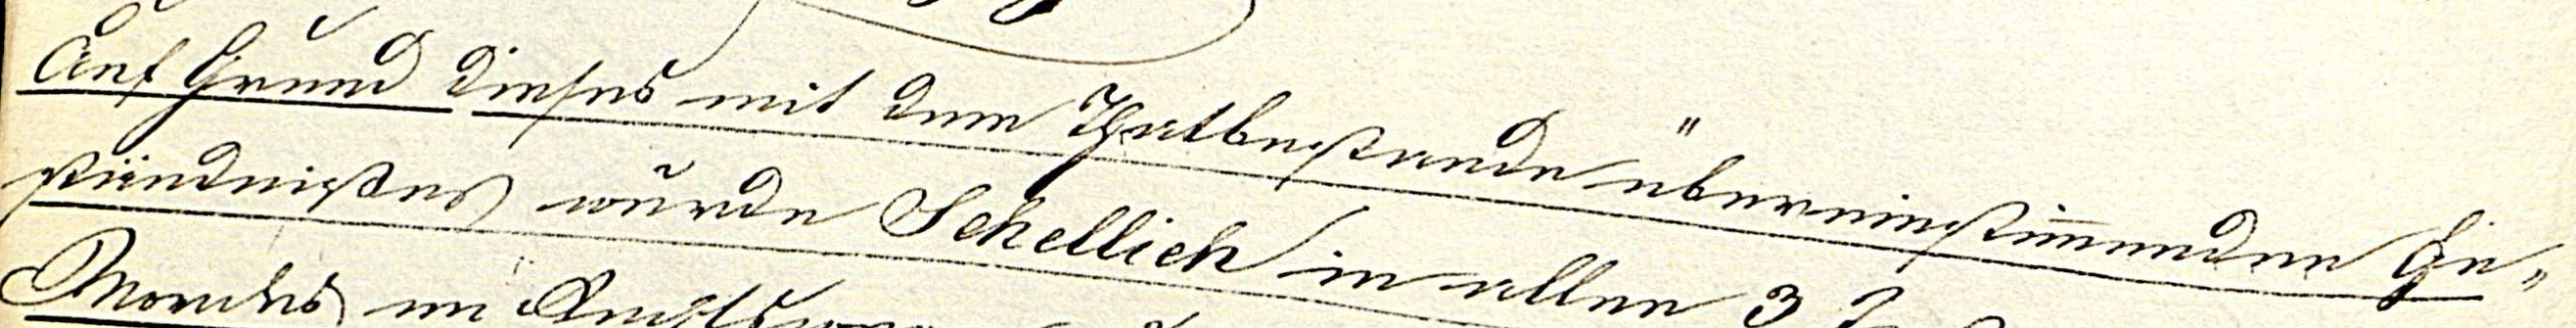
Auf Grund dieses mit dem Thatbestande übereinstimmenden Ge¬
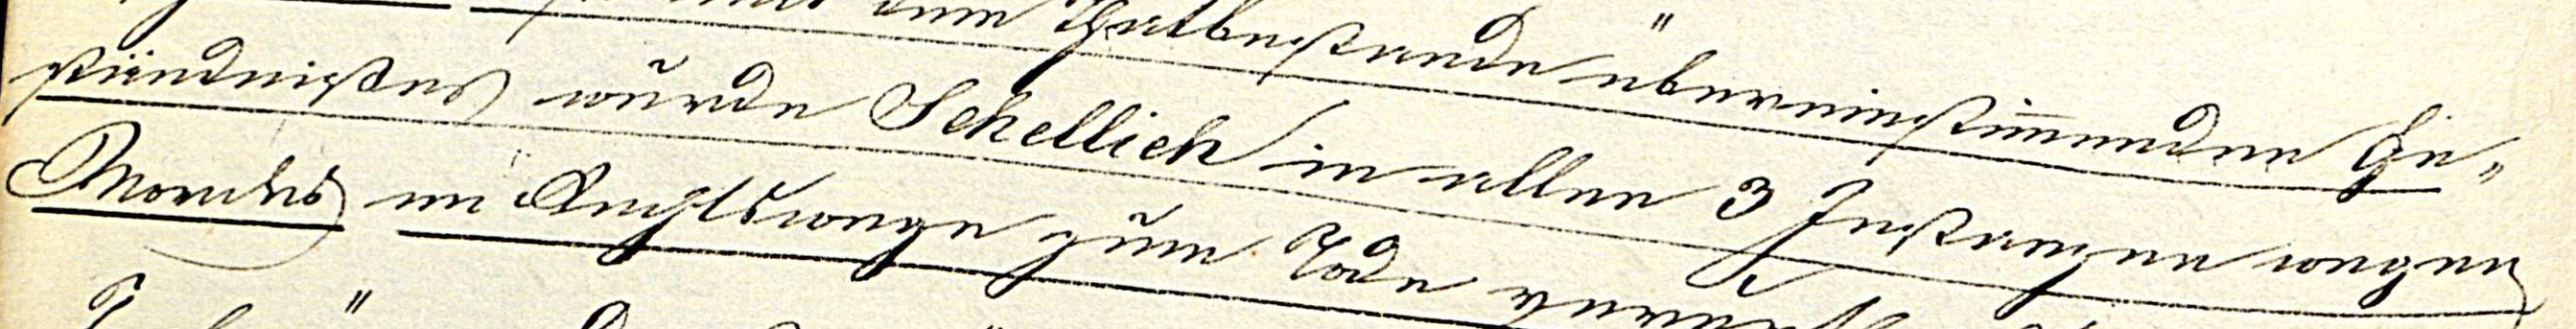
ständnißes wurde Schellich in allen 3 Instanzen wegen
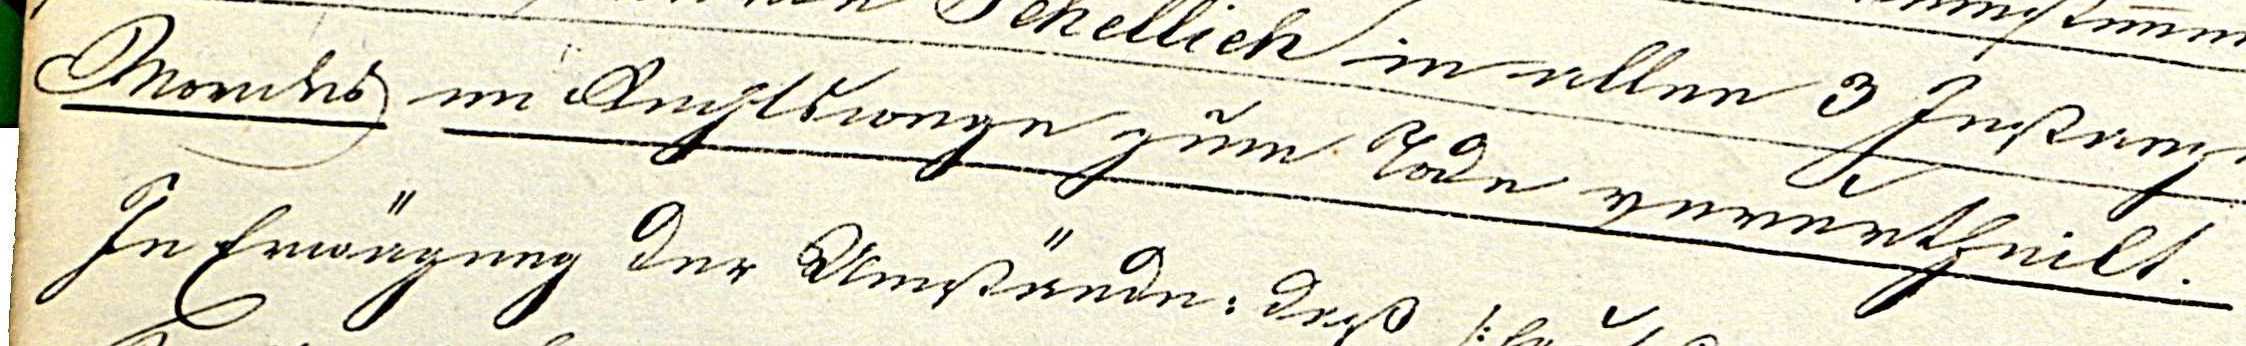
Mordes an Rechtswege zum Tode verurtheilt.
